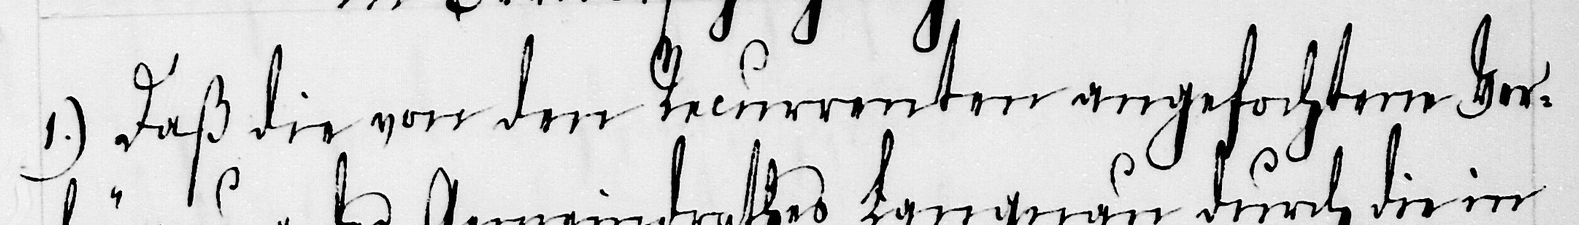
1.) Daß die von den Recurrenten angefochtene Ver¬
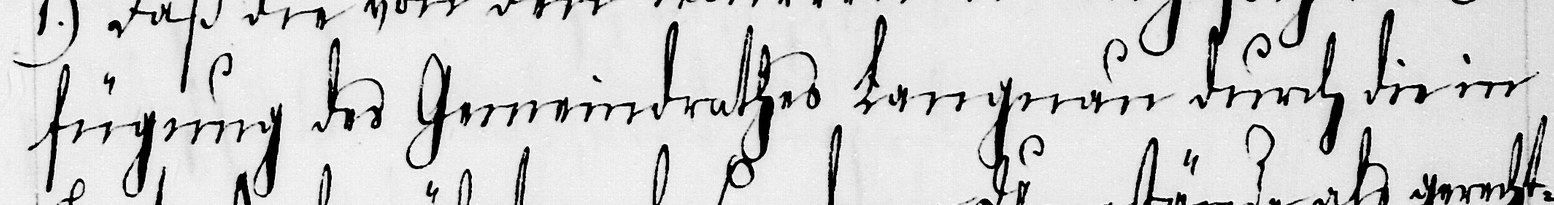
fügung des Gemeindrathes Langnau durch die in
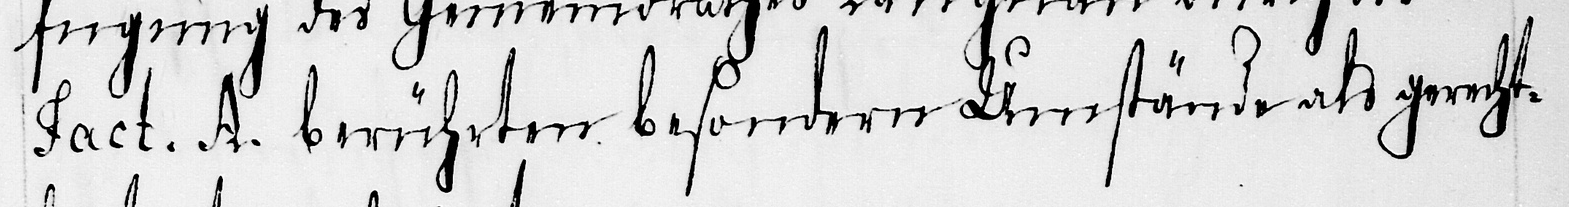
Fact. A. berührten besondern Umstände als gerecht¬
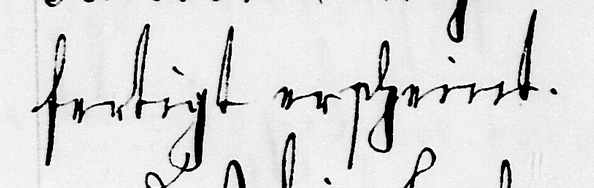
fertigt erscheint.
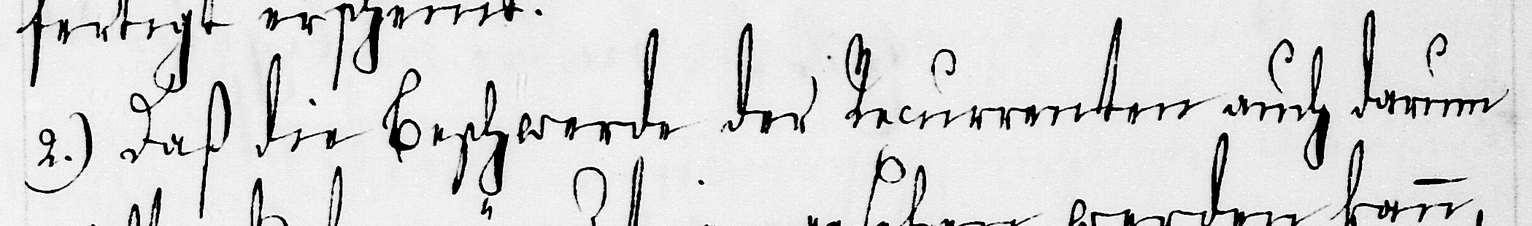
2.) Daß die Beschwerde der Recurrenten auch darum
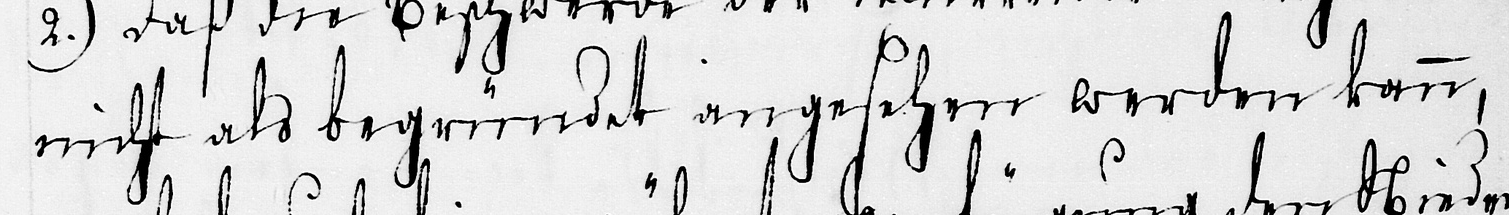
nicht als begründet angesehen werden kann,
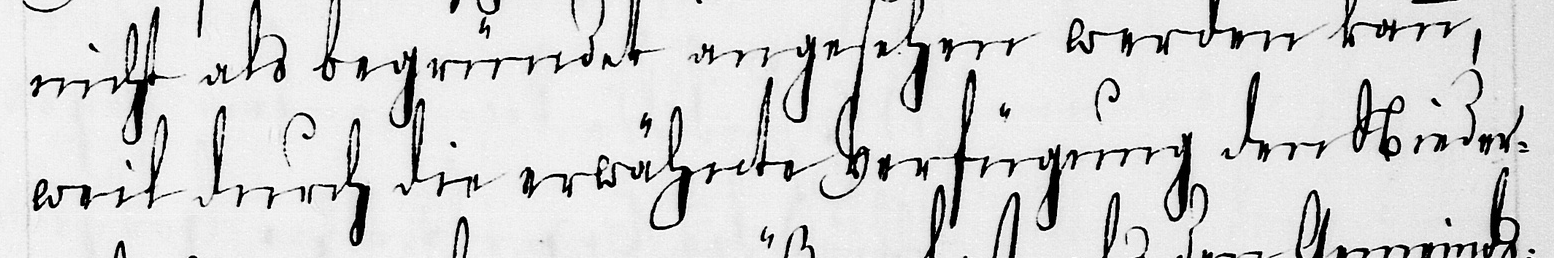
weil durch die erwähnte Verfügung den Nieder¬
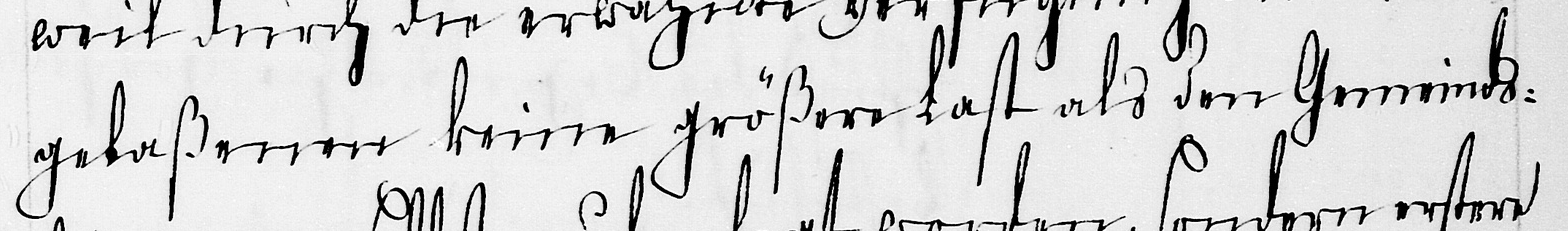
gelaßenen keine größere Last als den Gemeinds¬
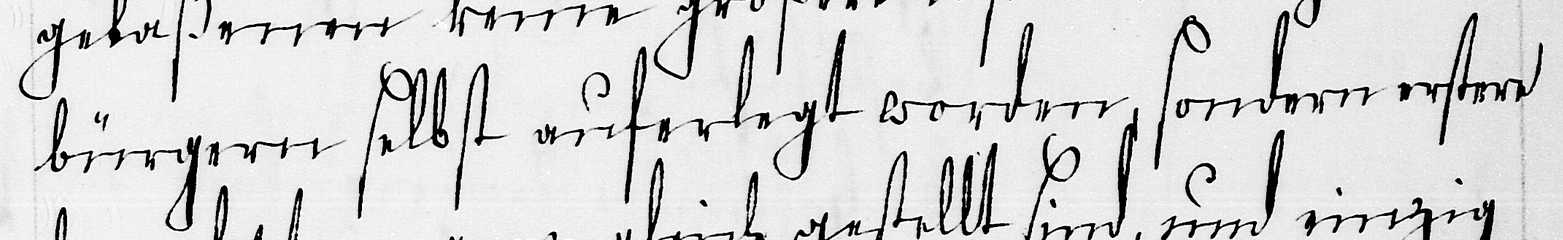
bürgern selbst auferlegt worden, sondern erstere
